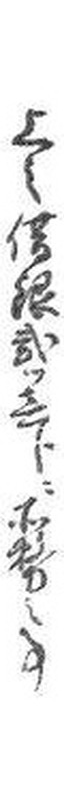上之借銀弐ッ壱分ニ所務之事
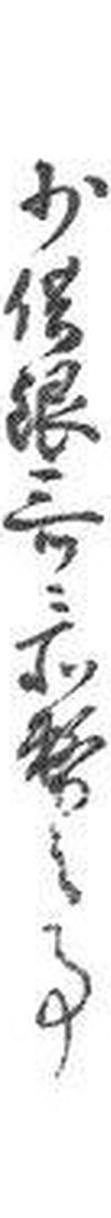少借銀三ッニ所務之事
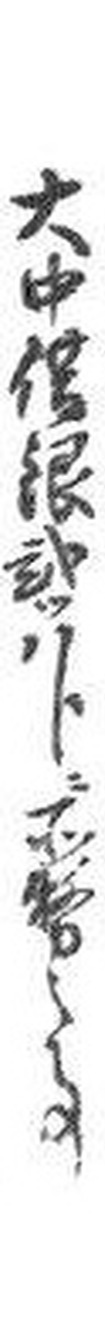大中借銀弐ッ八分ニ所務之事
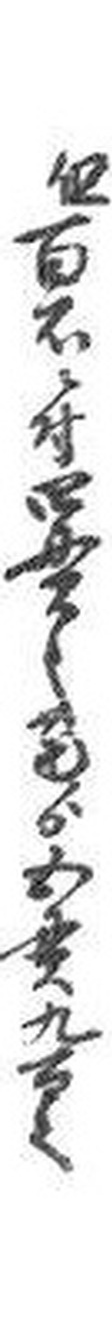但百石ニ付四貫匁当ゟ五貫九百匁
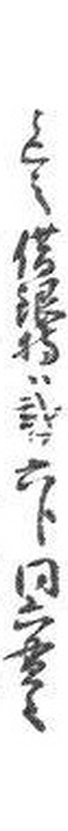迄之借銀持は弐ッ七分同拾貫匁ゟ
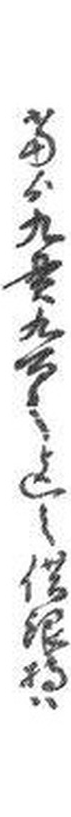当ゟ九貫九百匁迄之借銀は
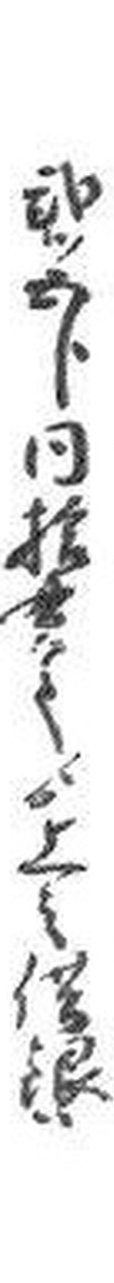弐ッ五分同拾貫匁ゟ上之借銀は
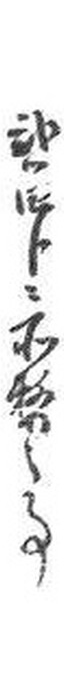弐ッ四分ニ所務之事
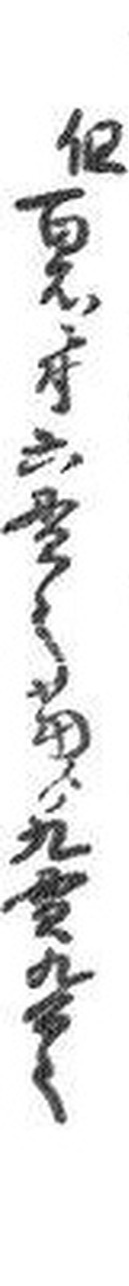但百石ニ付六貫匁当ゟ九貫九百匁
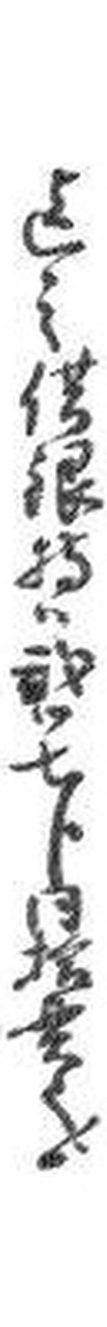迄之借銀持は弐ッ七分同拾貫匁ゟ
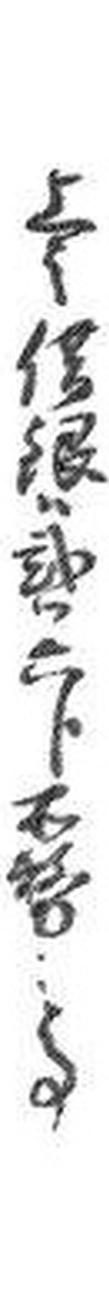上之借銀は弐ッ六分所務之事
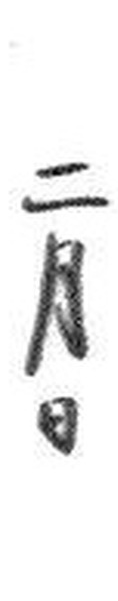二月日
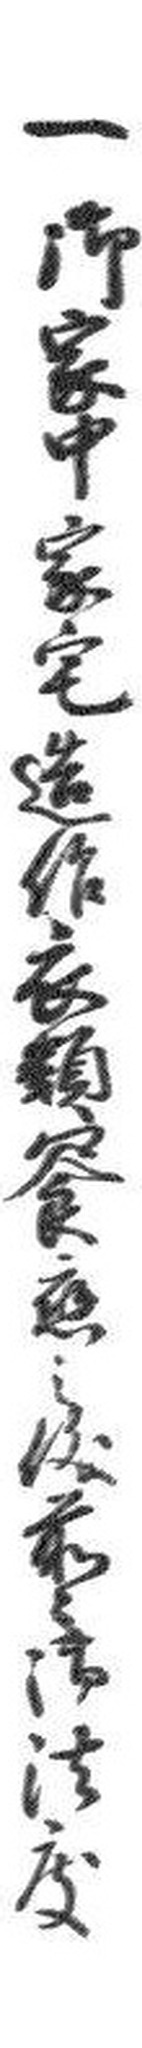一御家中家宅造作衣類饗応之儀前々御法度
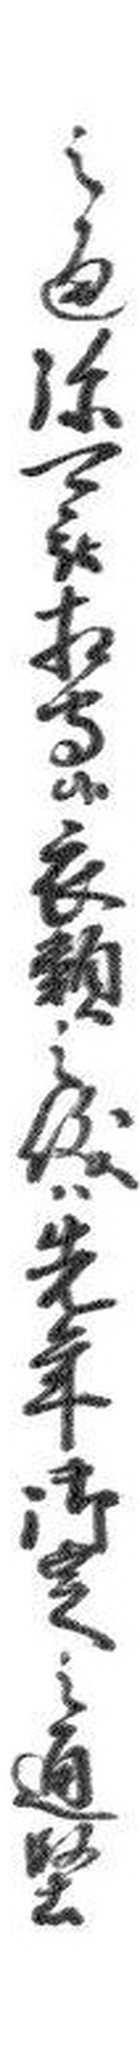之通弥可被相守候衣類之儀は先年御定之通堅
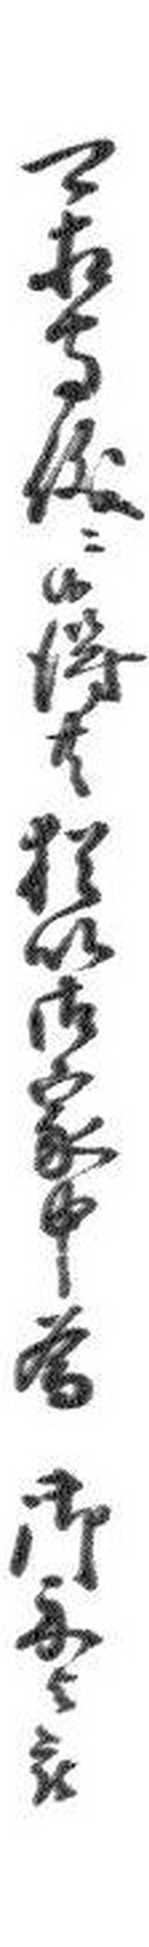可相守儀ニ候得共猶以御家中為御示と被
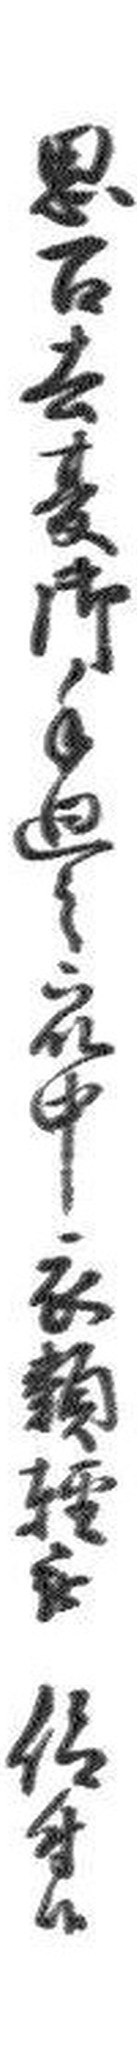思召去夏御手廻之衆中衣類軽被仰付候
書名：家譜 八 光通公 従寛文十年到同十二年
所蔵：福井県文書館 Fukui Prefectural Archives
